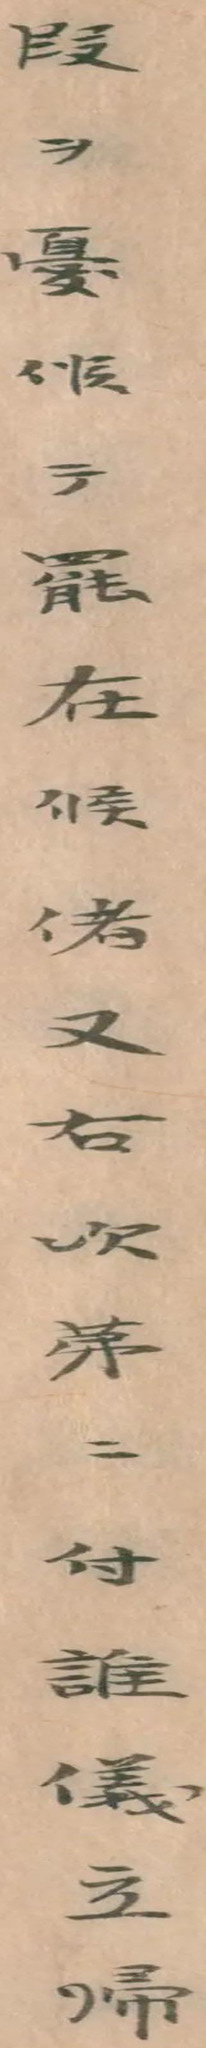段ヲ憂候テ罷在候偖又右次第二付誰儀立帰
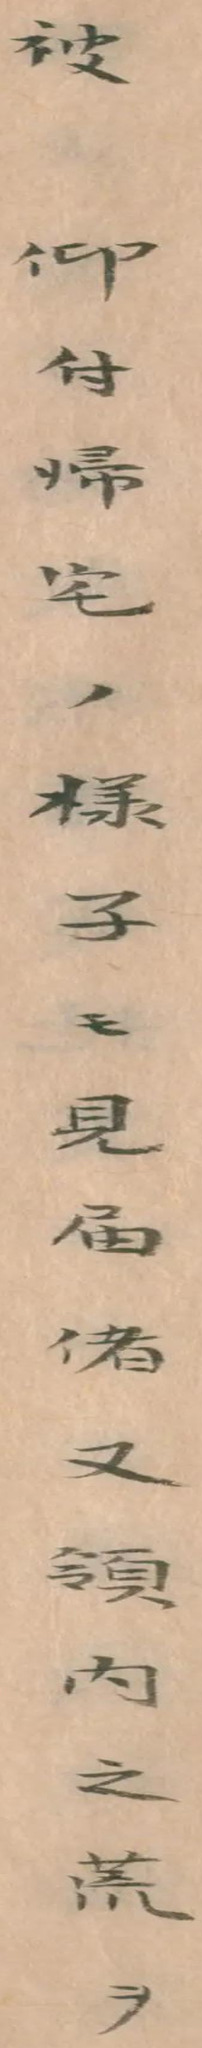被仰付帰宅ノ様子モ見届偖又領内之荒ヲ
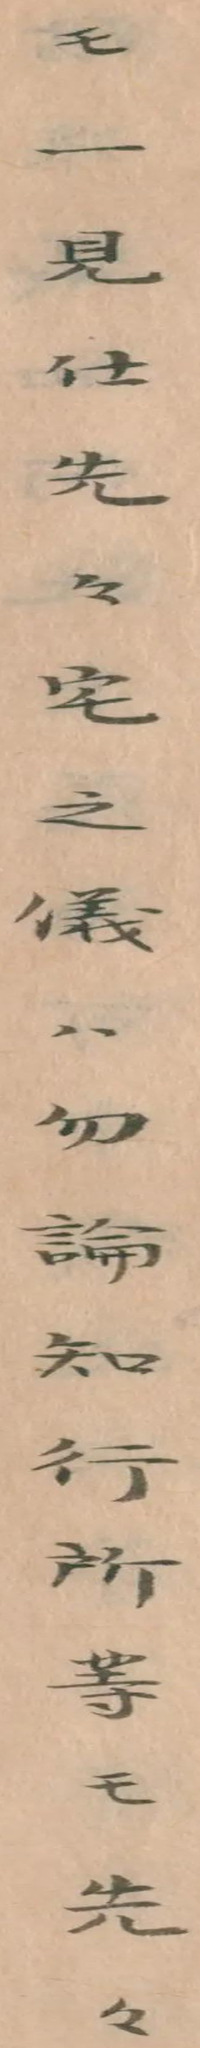モ一見仕先々宅之儀ハ勿論知行所等モ先々
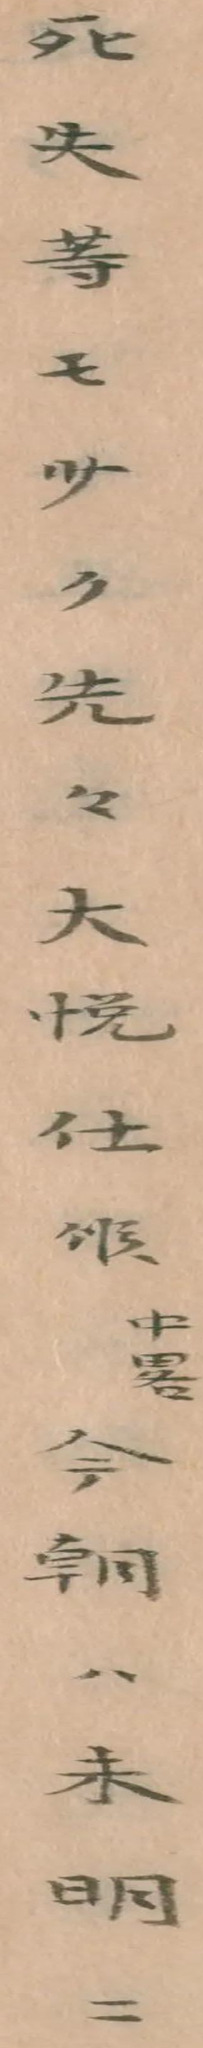死失等モ少ク先々大悦仕候中畧今朝ハ未明二
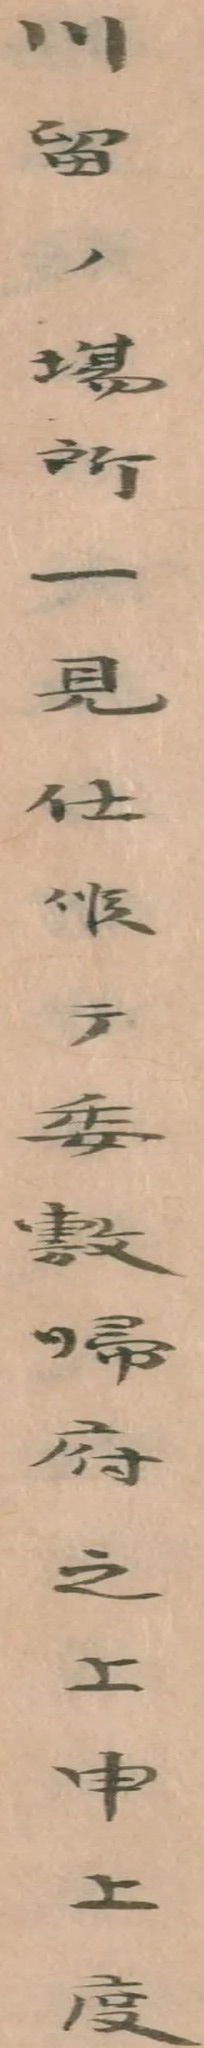川留ノ場所一見仕候テ委敷帰府之上申上度
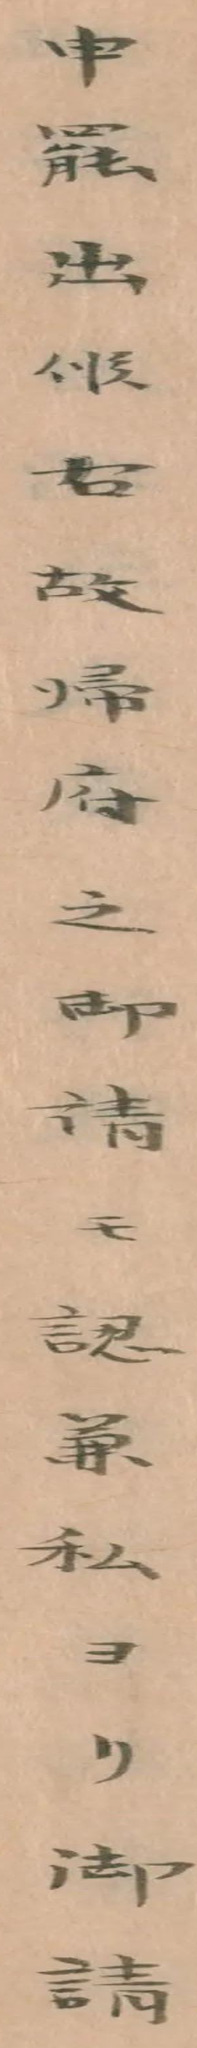申罷出候右故帰府之御請モ認兼私ヨリ御請
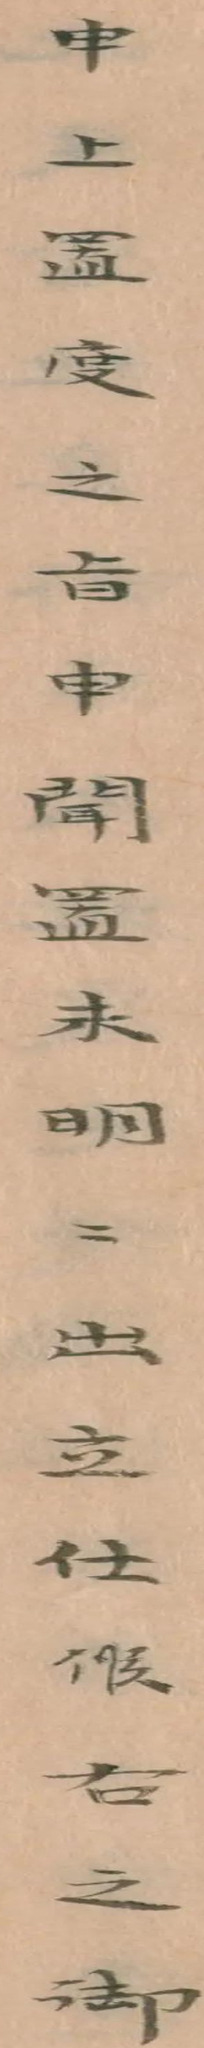申上置度之旨申聞置未明二出立仕候右之御
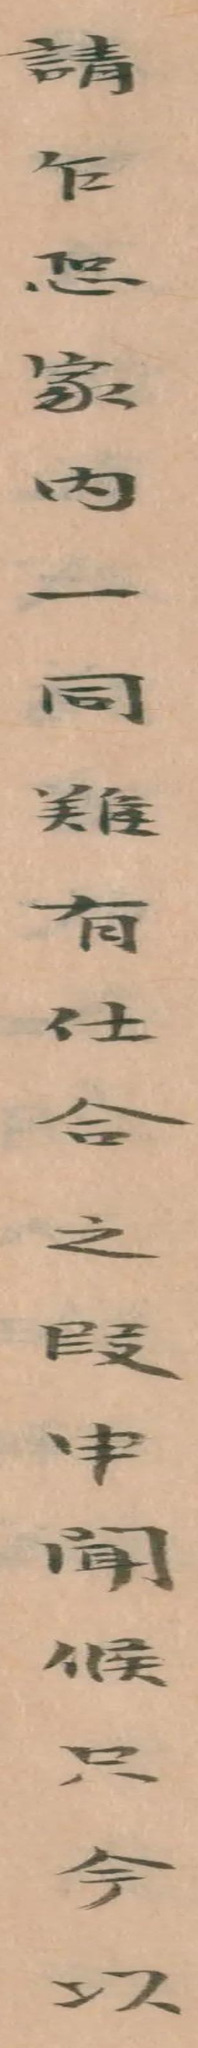請乍恐家内一同難有仕合之段申聞候只今以
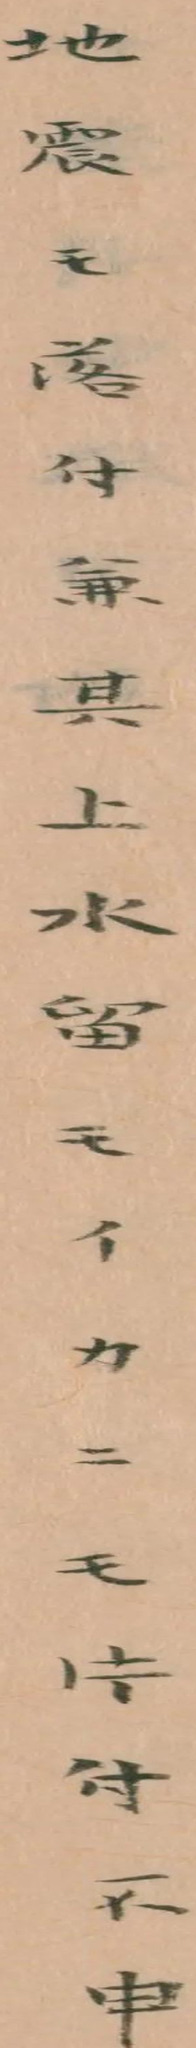地震モ落付兼其上水留モイカニモ片付不申
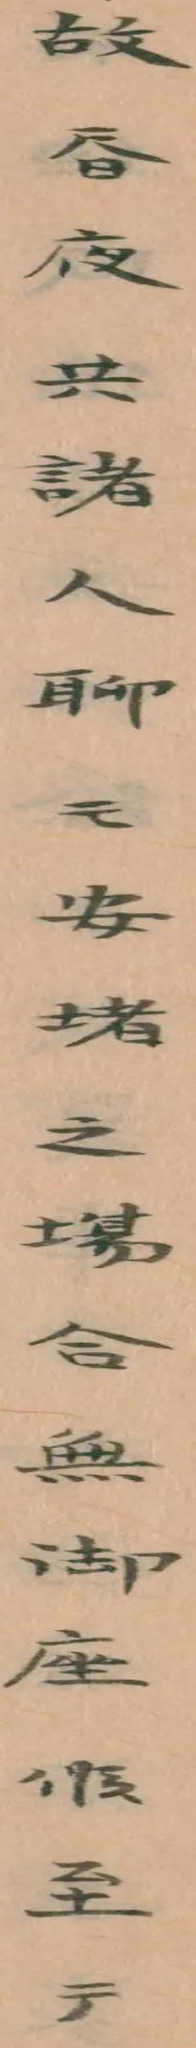故昼夜共諸人聊モ安堵之場合無御座候至テ」
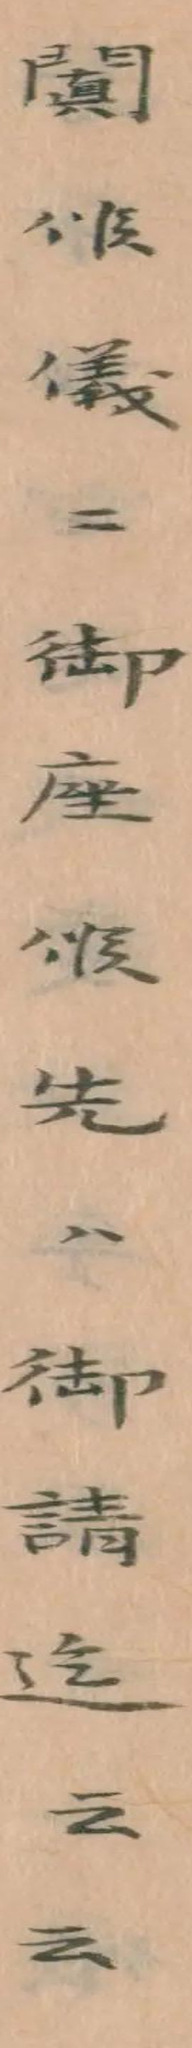闇候儀二御座候先ハ御請迄云云
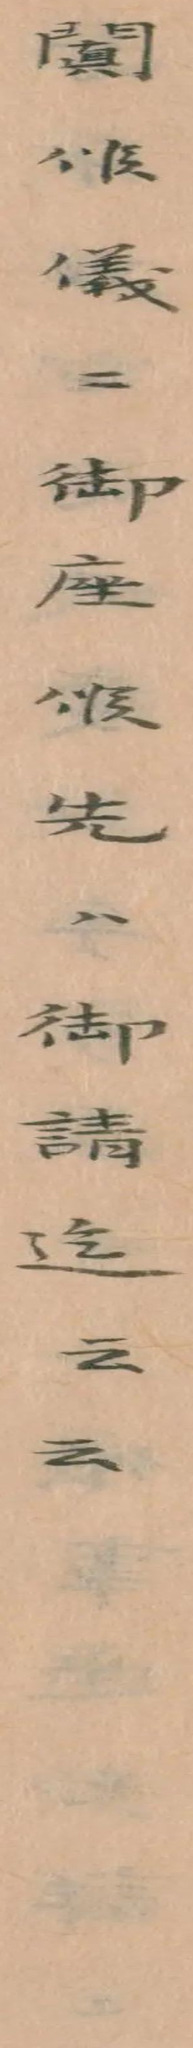闇候儀二御座候先ハ御請迄云云
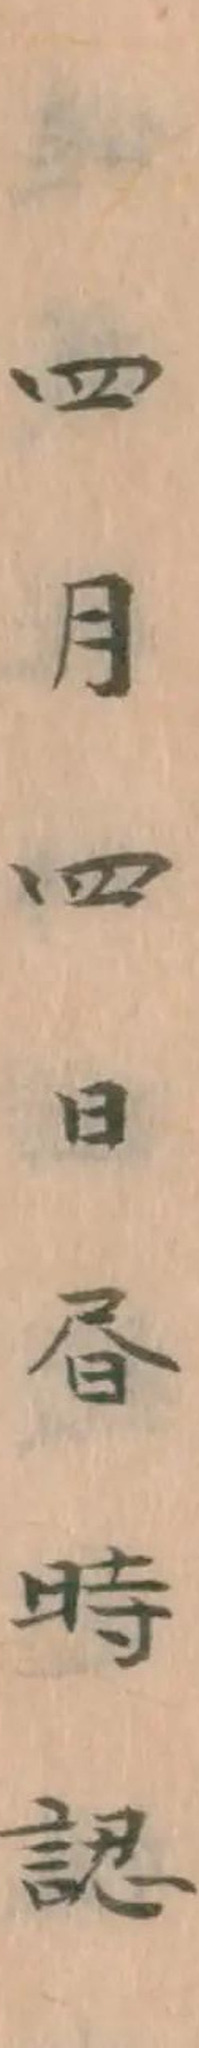四月四日昼時認
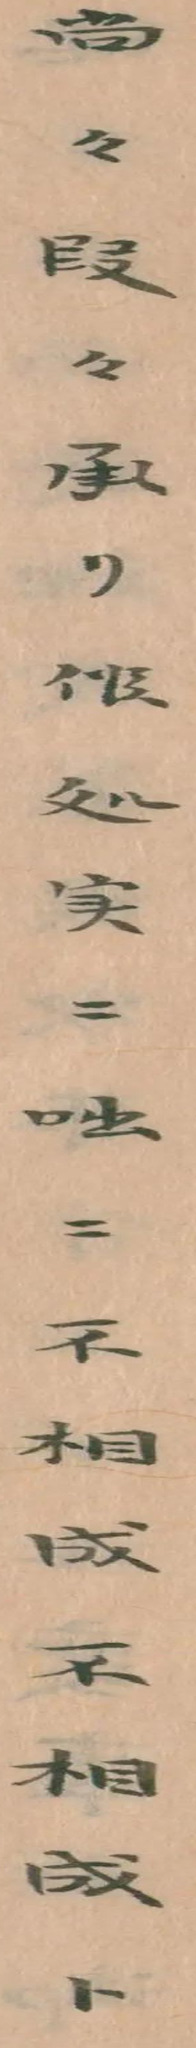尚々段々承り候処実二咄二不相成不相成ト
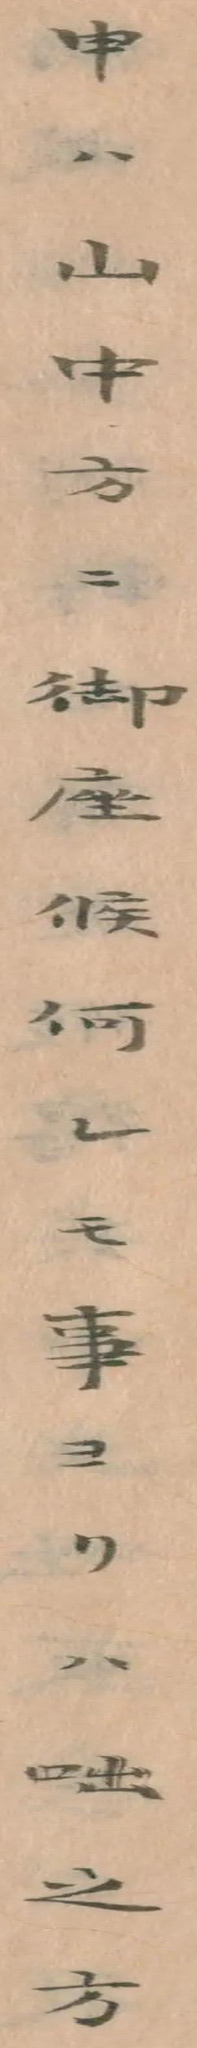申ハ山中方二御座候何レモ事ヨリハ咄之方
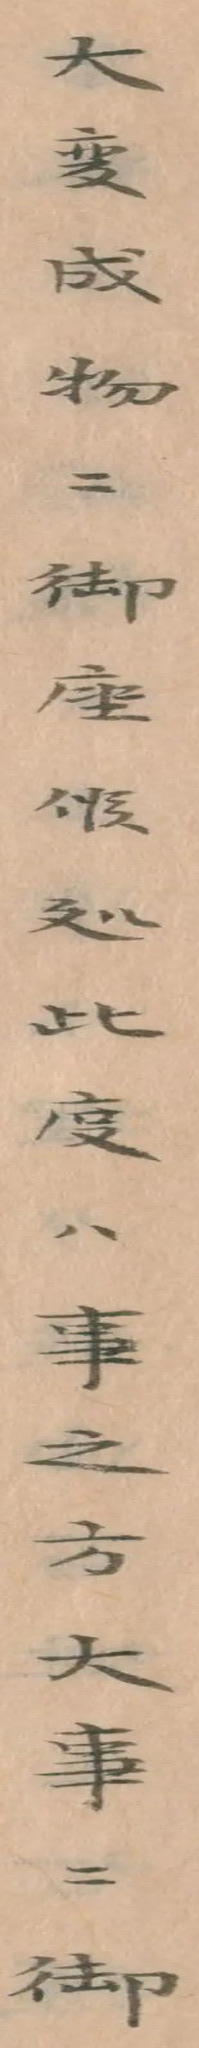大変成物二御座候処此度ハ事之方大事二御
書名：地災撮要. 巻1(噴火山・地震ノ部)
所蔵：国立国会図書館 National Diet Library, JAPAN
